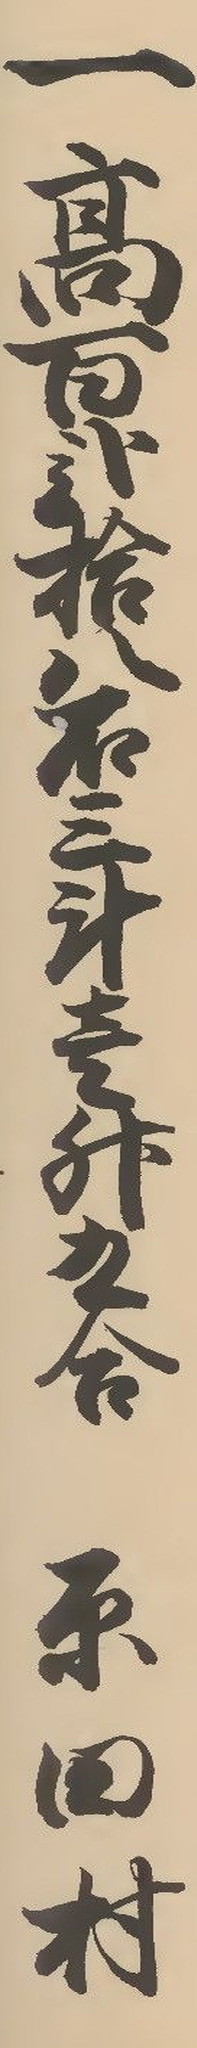一髙百弐拾八石三斗壱升九合原田村
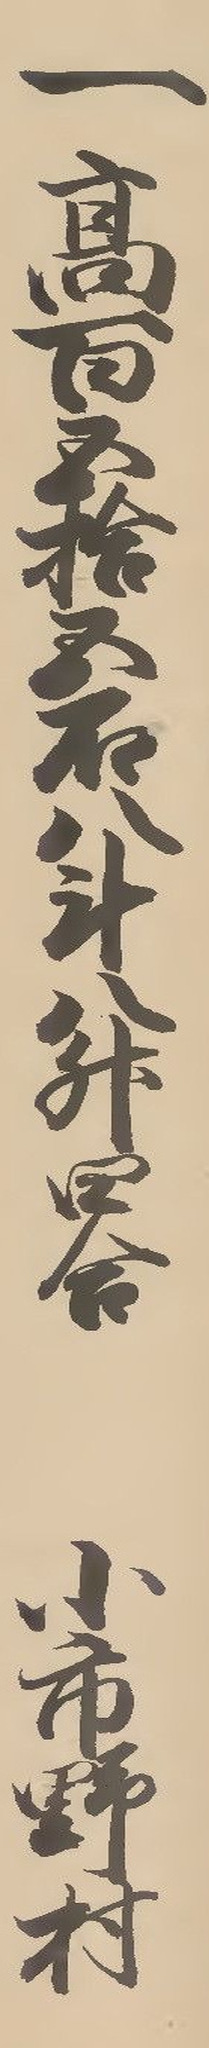一髙百五拾五石八斗八升四合小市野村
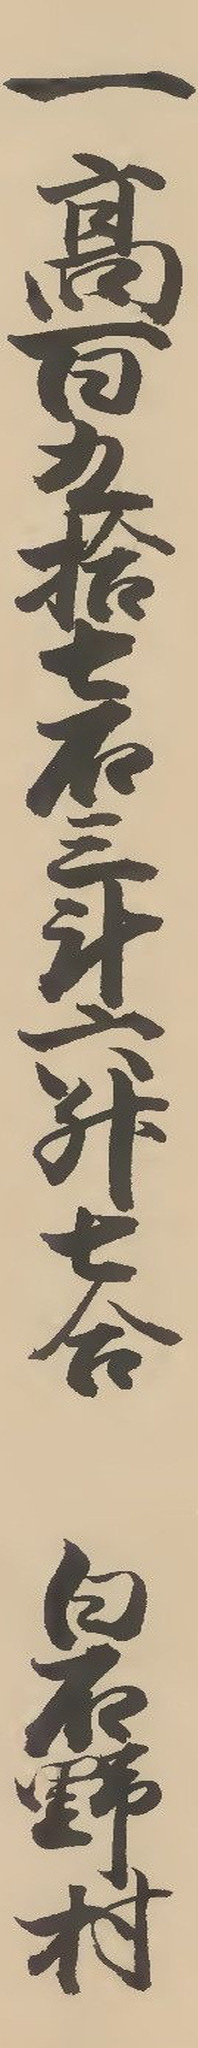一髙百九拾七石三斗六升七合白石野村
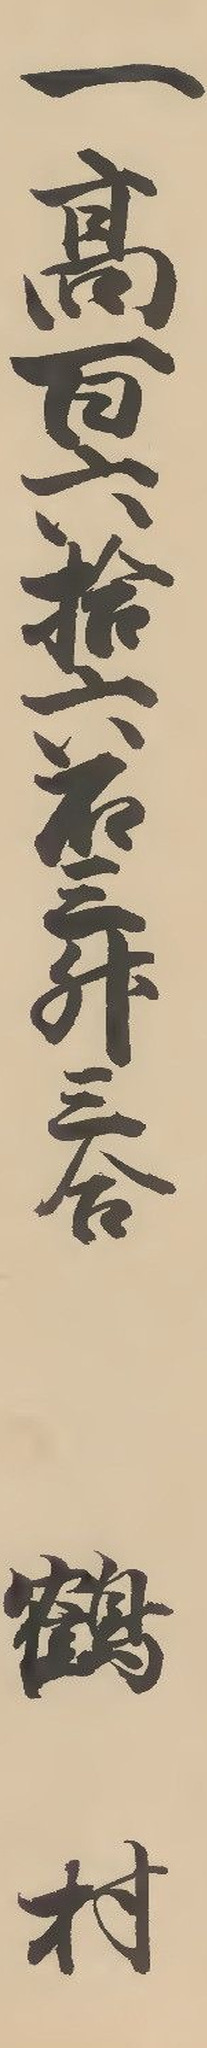一髙百六拾六石三升三合鶴村
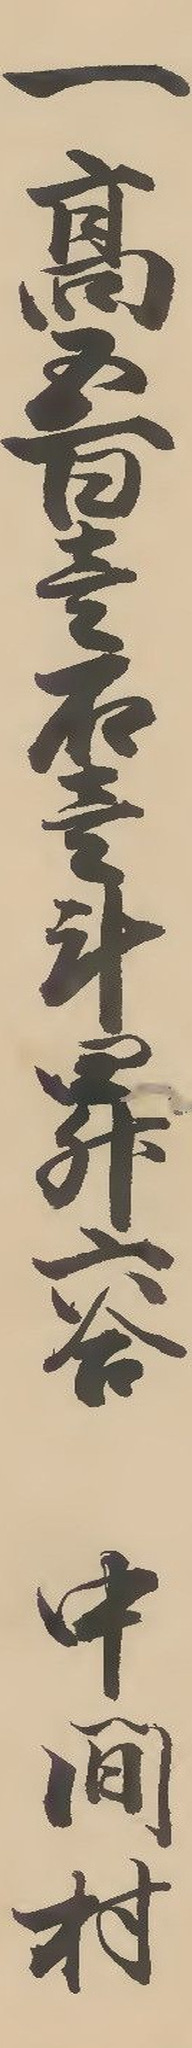一髙五百壱石壱斗四升六合中間村

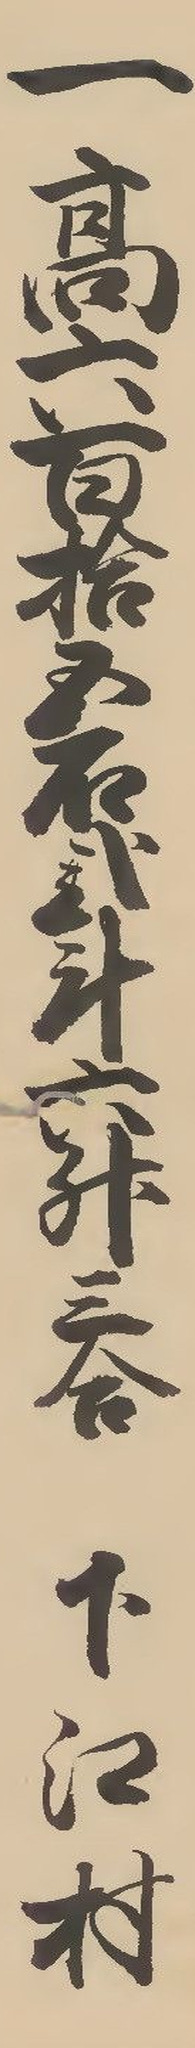一髙六百拾五石弐斗六升三合下江村
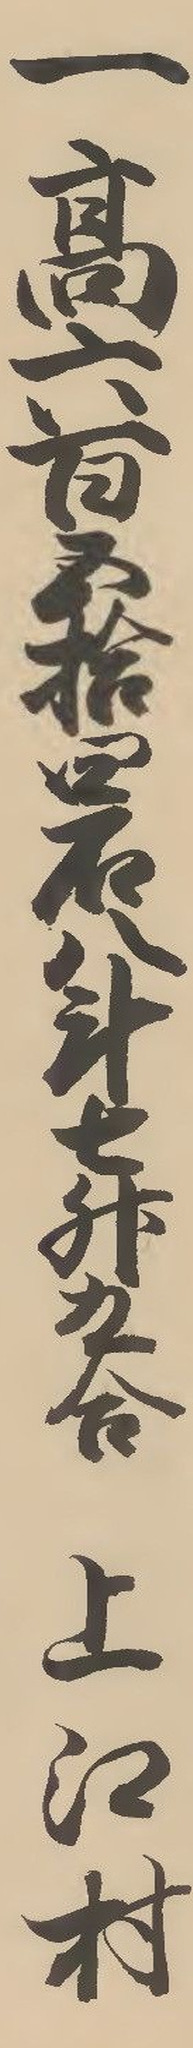一髙六百五拾四石八斗七升九合上江村
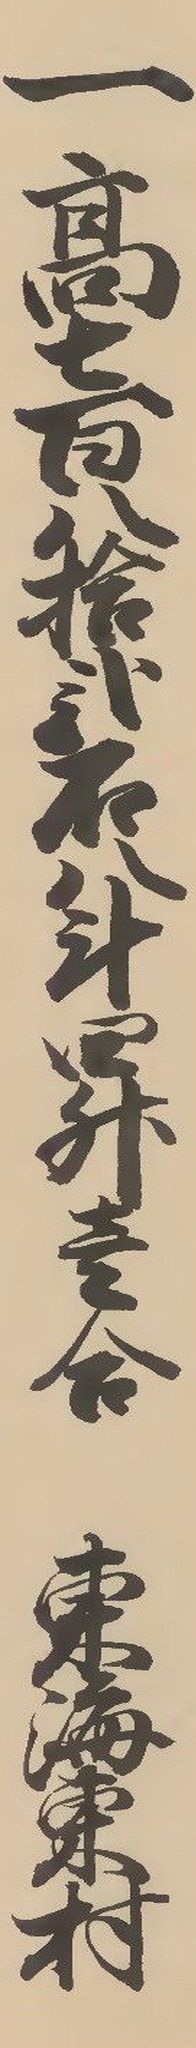一髙七百八拾弐石八斗四升壱合東海東村
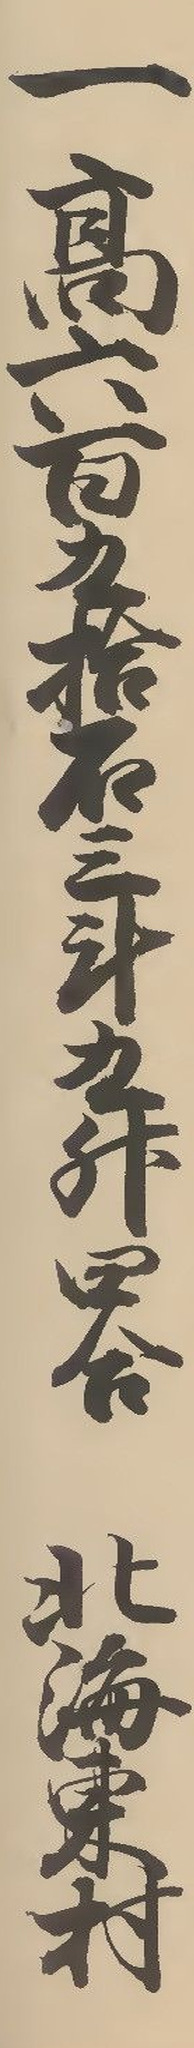一髙六百九拾石三斗九升四合北海東村
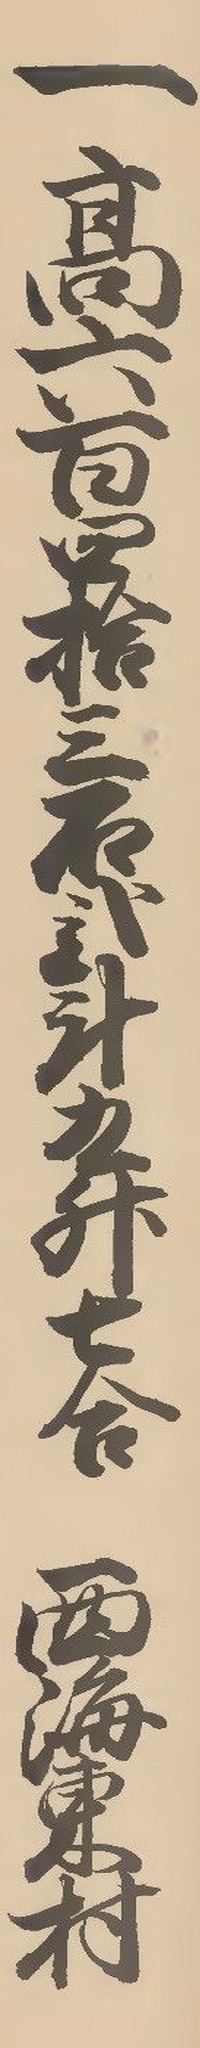一髙六百四拾三石弐斗九升七合西海東村
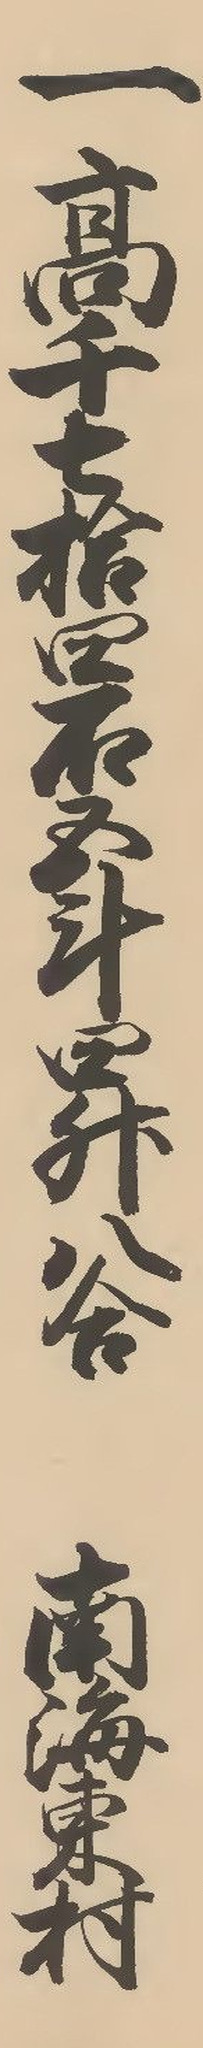一髙千七拾四石五斗四升八合南海東村
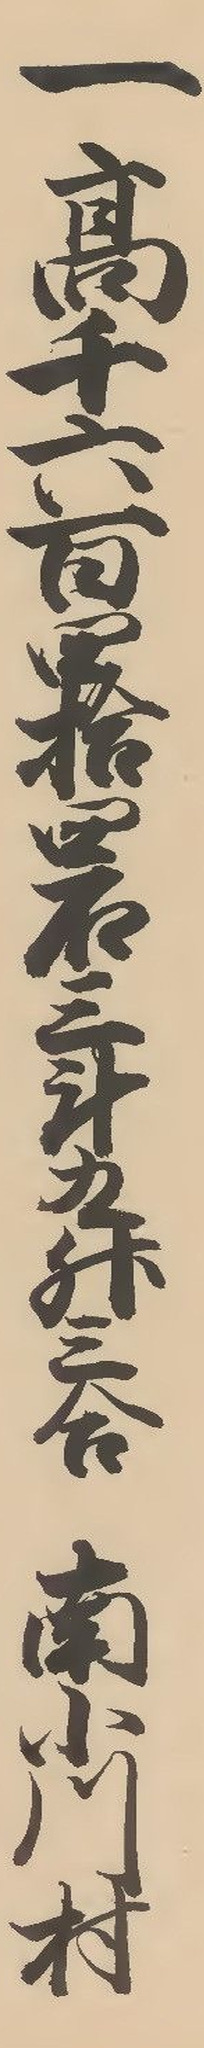一髙千六百四拾四石三斗九升三合南小川村
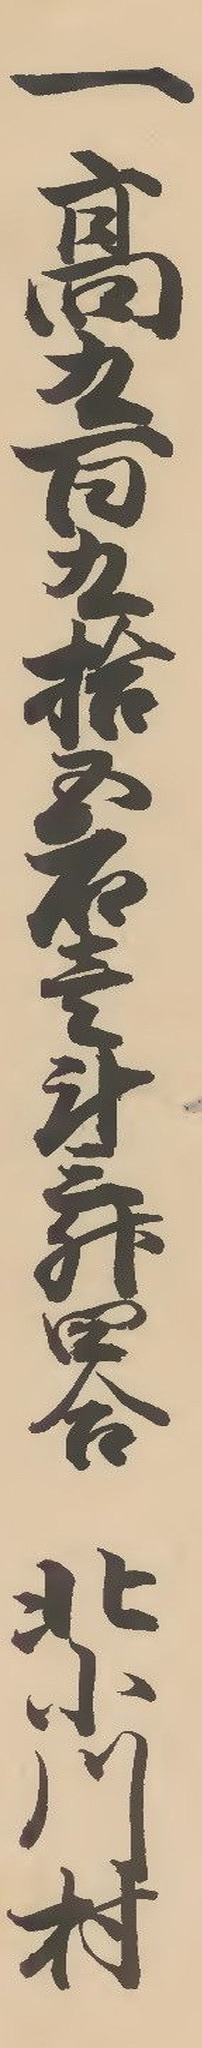一髙九百九拾五石壱斗三升四合北小川村

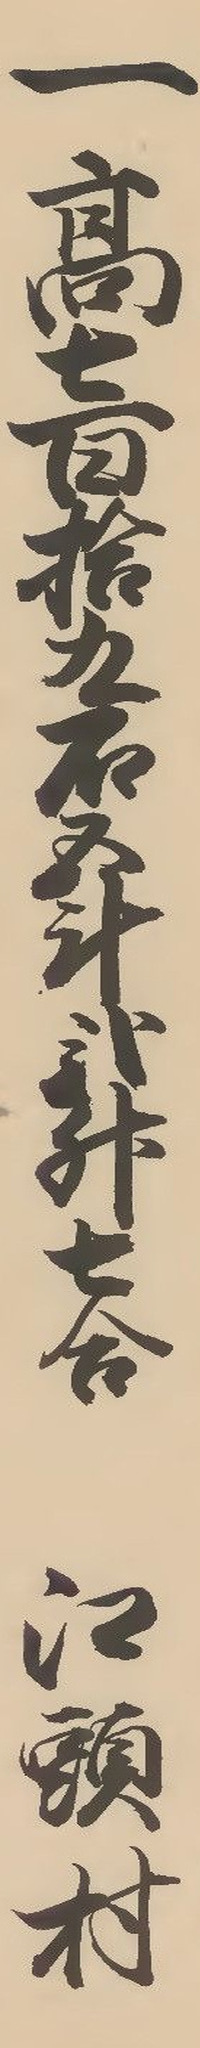一髙七百拾九石五斗弐升七合江頭村
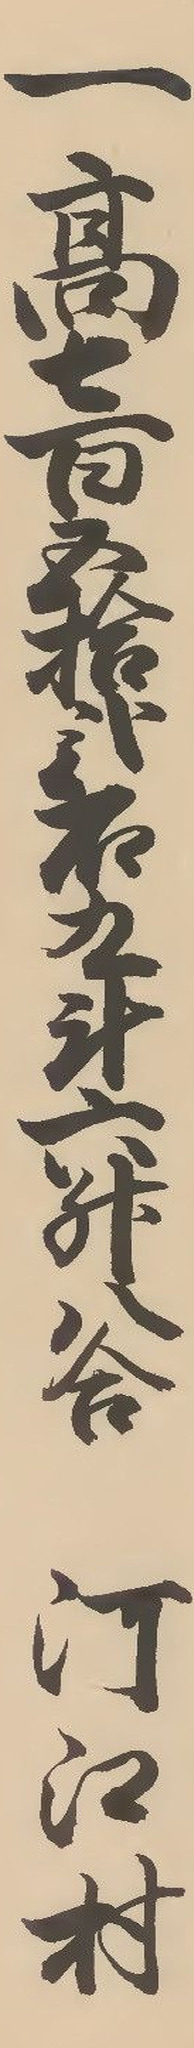一髙七百五拾弐石九斗六升八合河江村
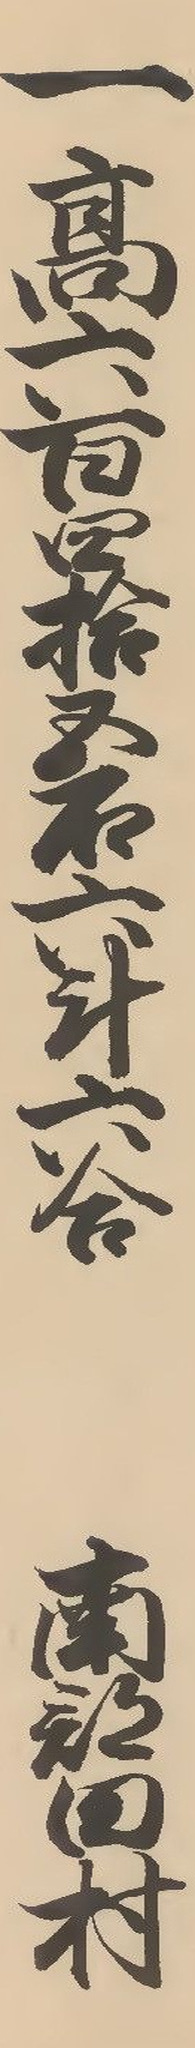一髙六百四拾五石六斗六合南部田村
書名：肥後国郷帳
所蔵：国立公文書館 National Archives of Japan
